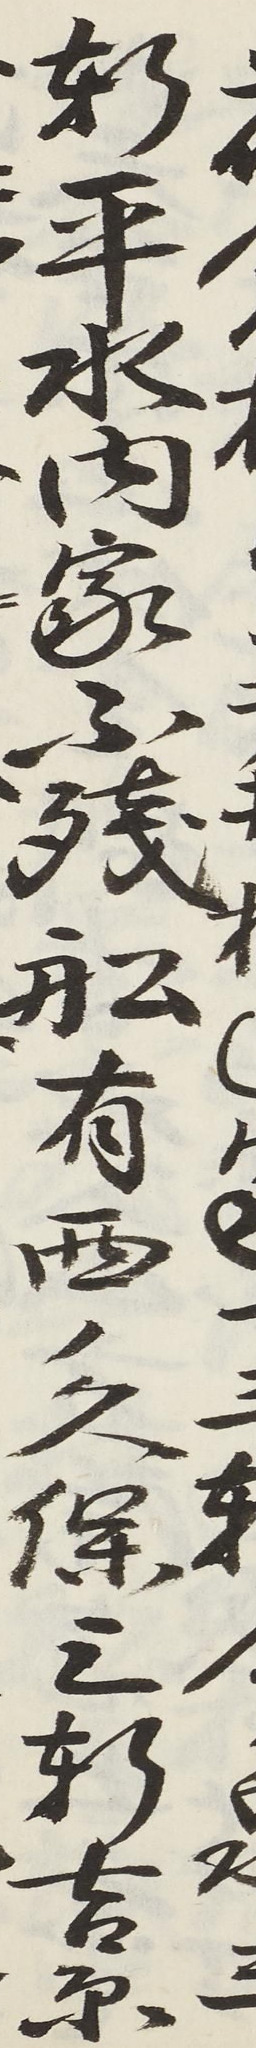軒平水内家不残船有西ノ久保三軒吉原
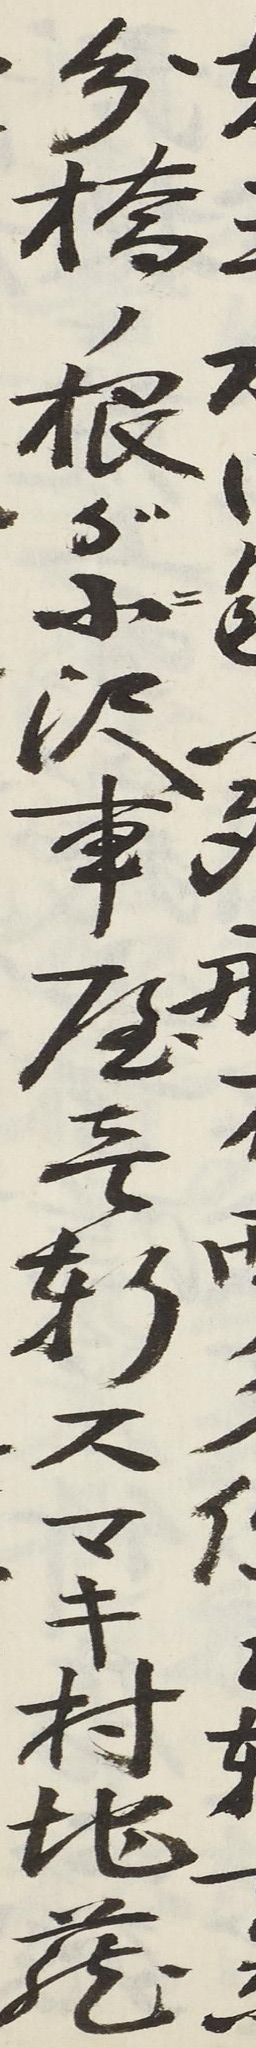分橋ノ根ガブ小沢車屋壱軒スマキ村地蔵
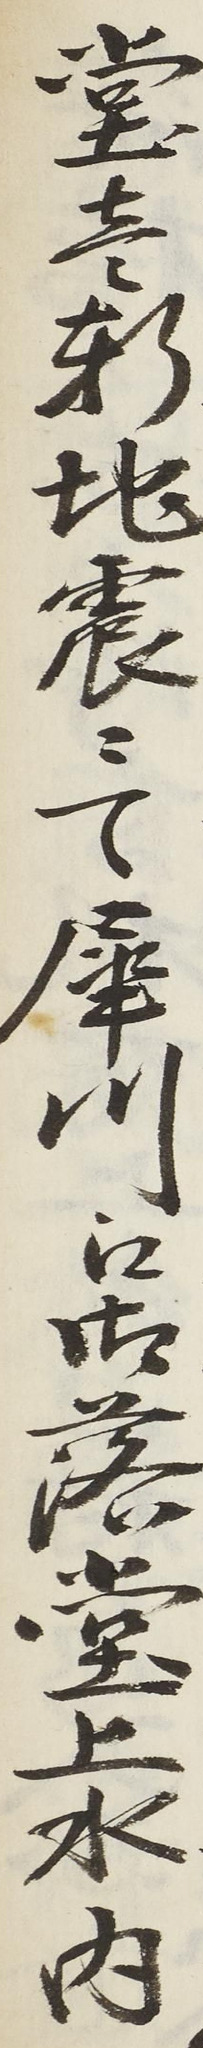堂壱軒地震二て犀川江御落堂上水内

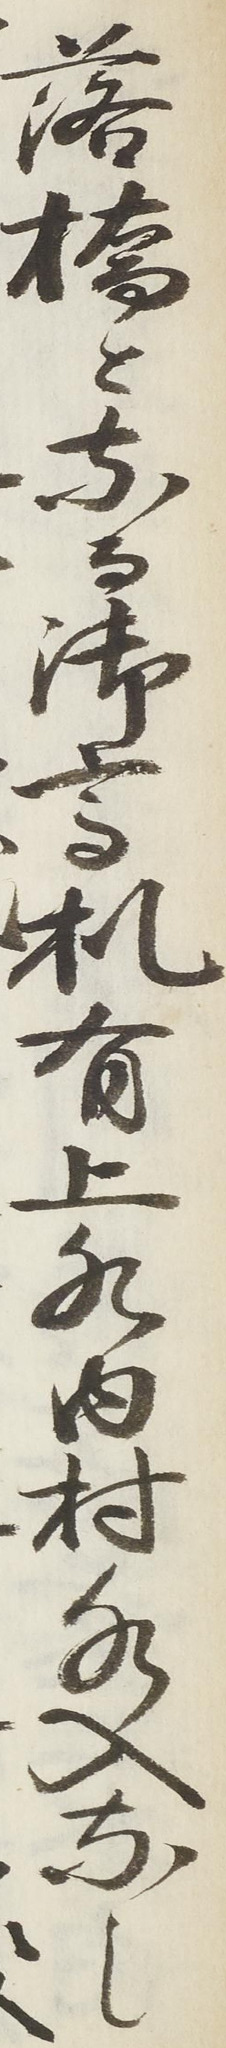落橋となる御高札有上水内村水入なし
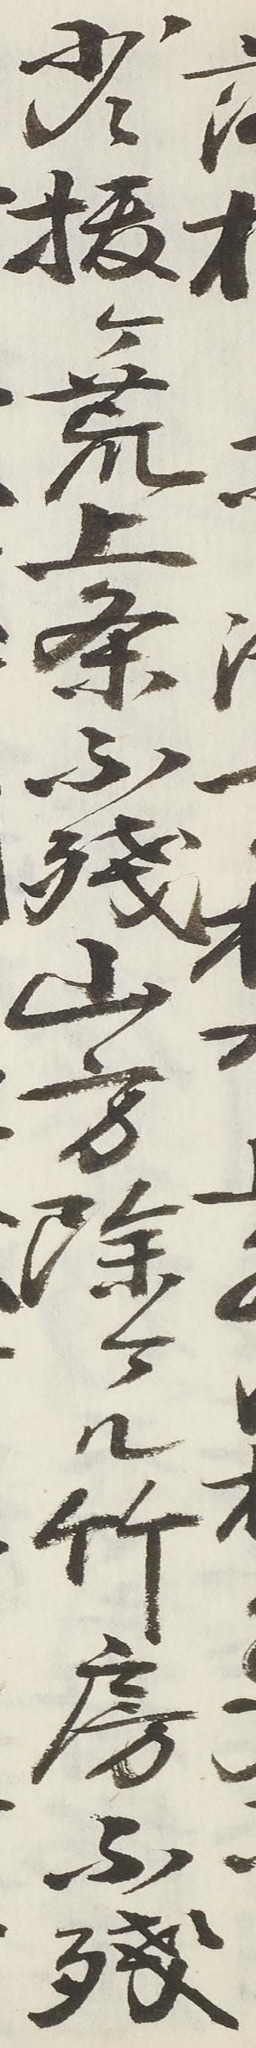少々抜ヶ荒上条不残山上ゟ除ケル竹房不残
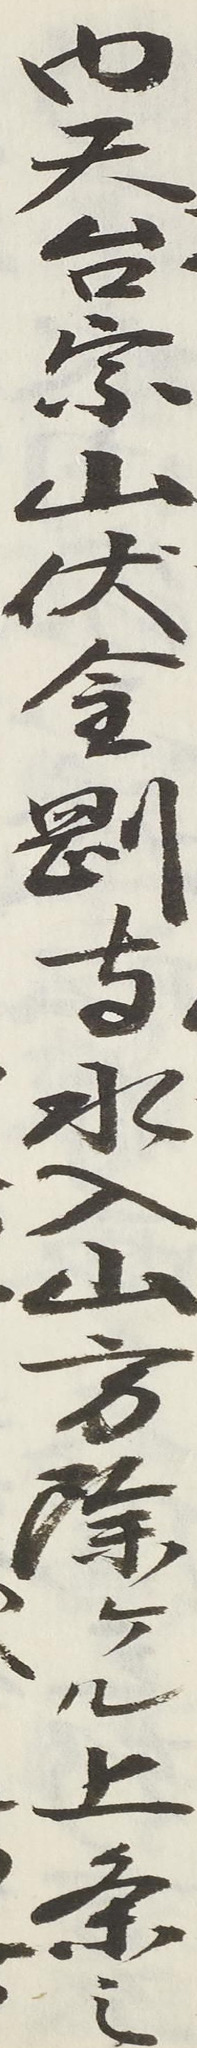内天台宗山伏金剛寺水入山上ゟ除ケル上条の
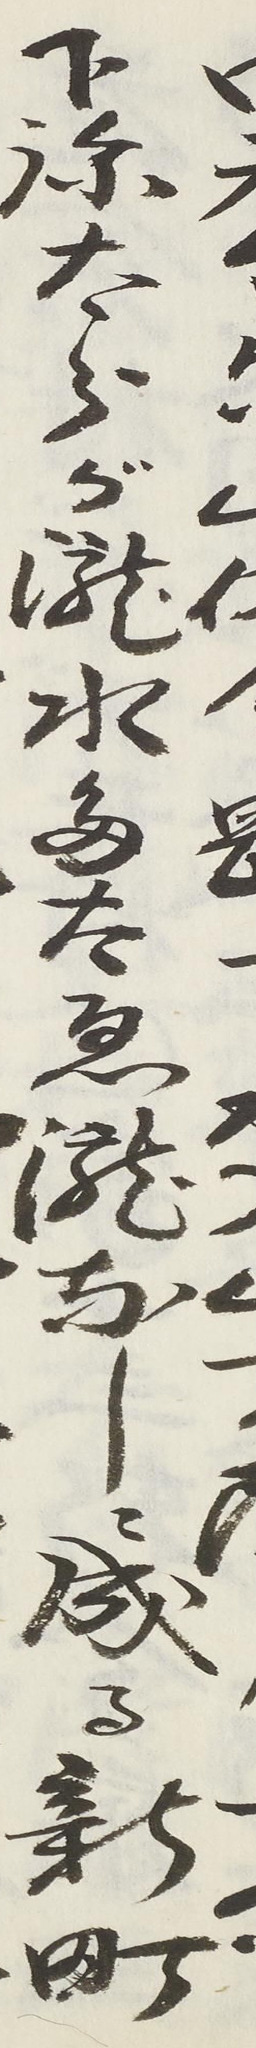下弥たゝらが瀧水たたゑ瀧なし二成る新町
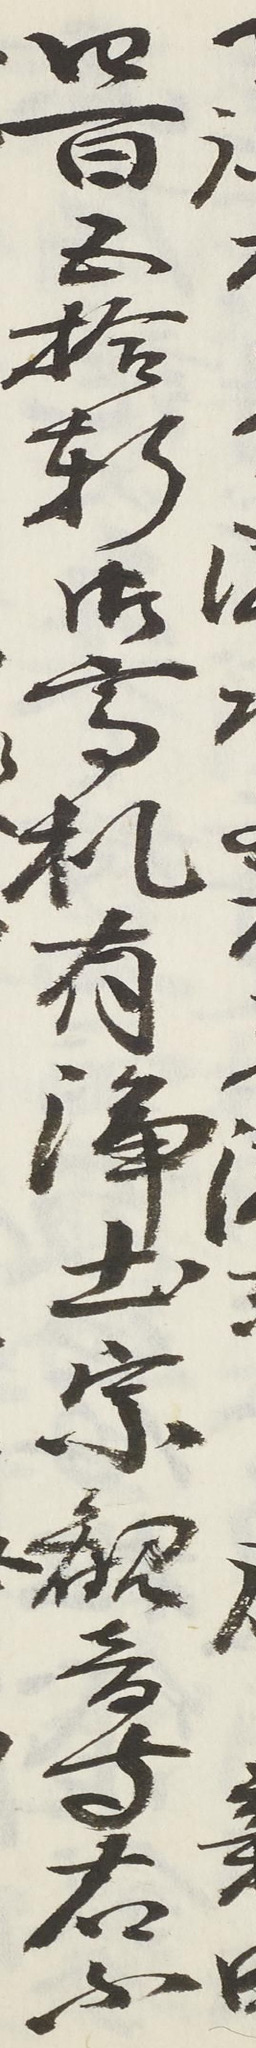四百五拾軒御高札有浄土宗観音寺右不
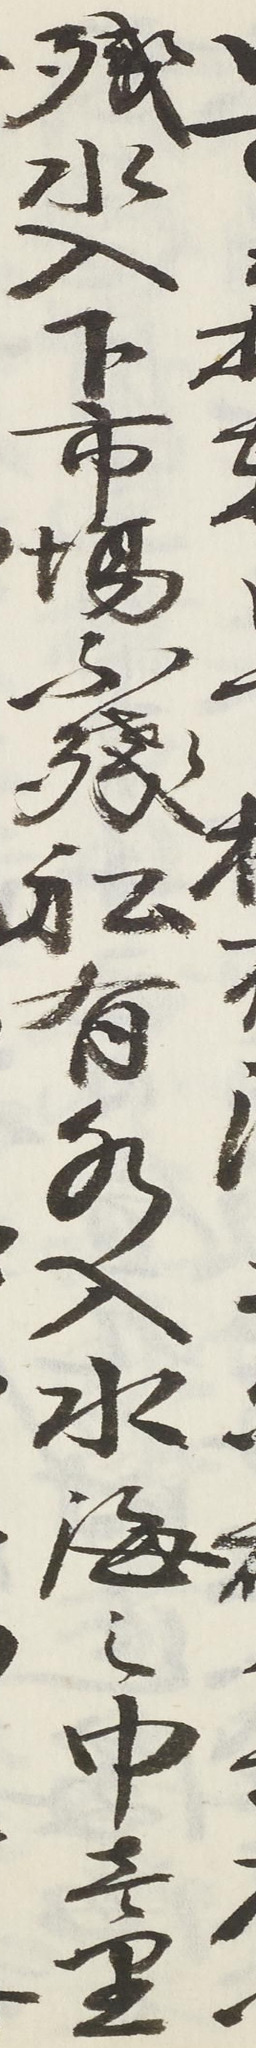残水入下市場不残船有水入水海之中壱里
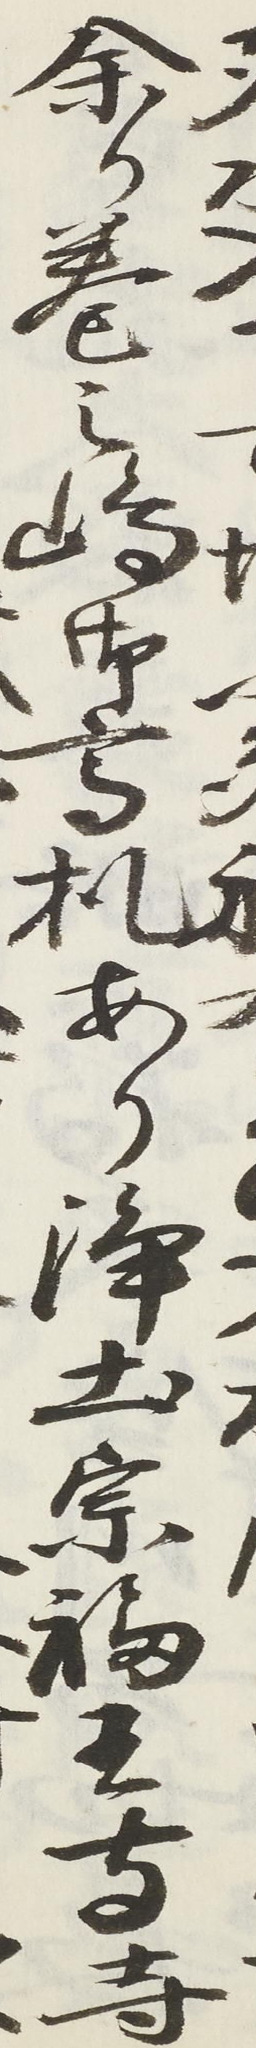余り巻之嶋御高札あり浄土宗福王寺寺
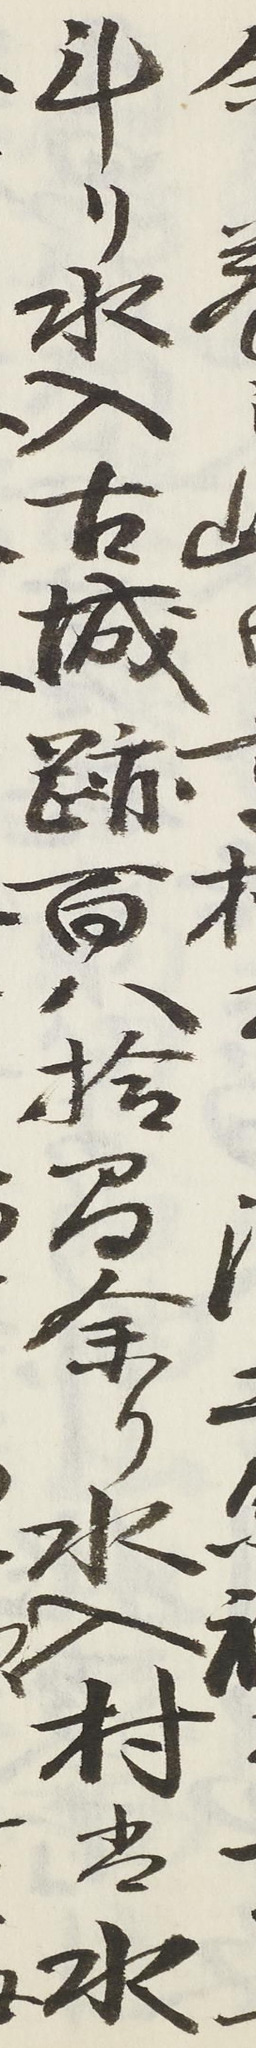斗り水入古城跡百八拾間余り水入村は水
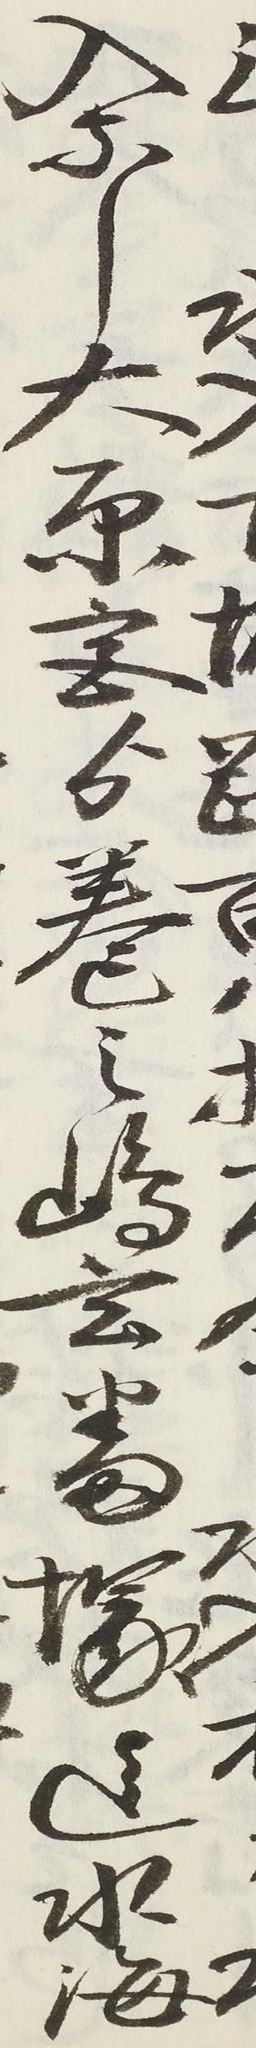入なし大原宮ゟ巻之嶋玄蕃塚迄水海
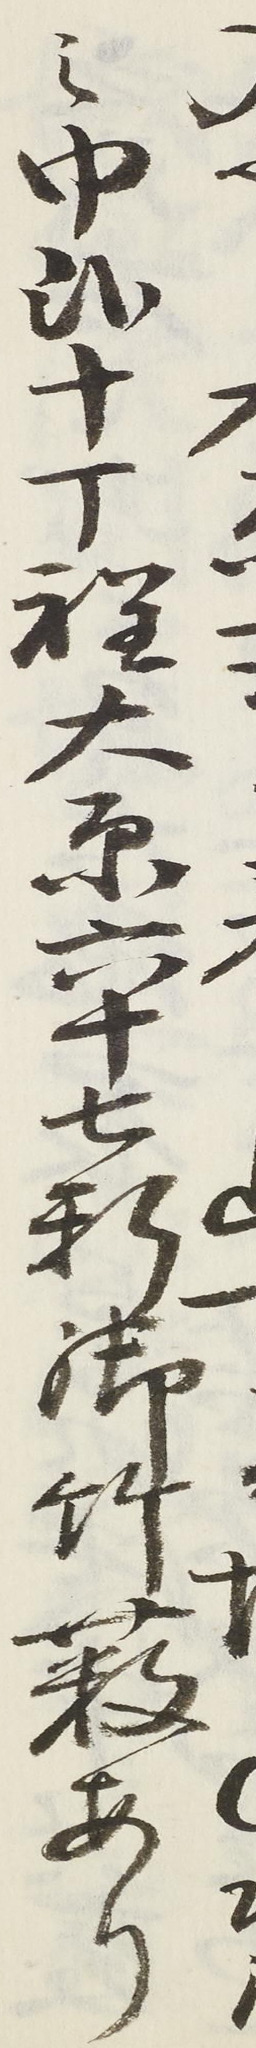之中弐十丁程大原六十七軒御竹藪あり
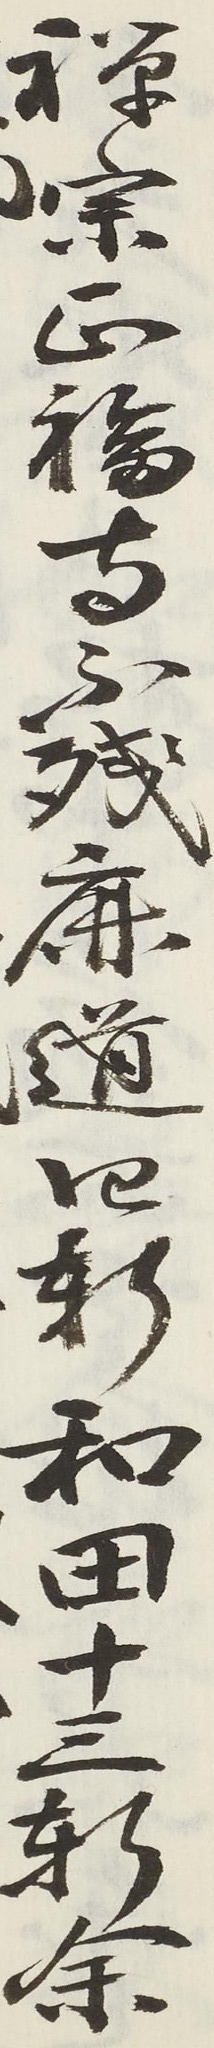禅宗正福寺不残廉道四軒和田十三軒余
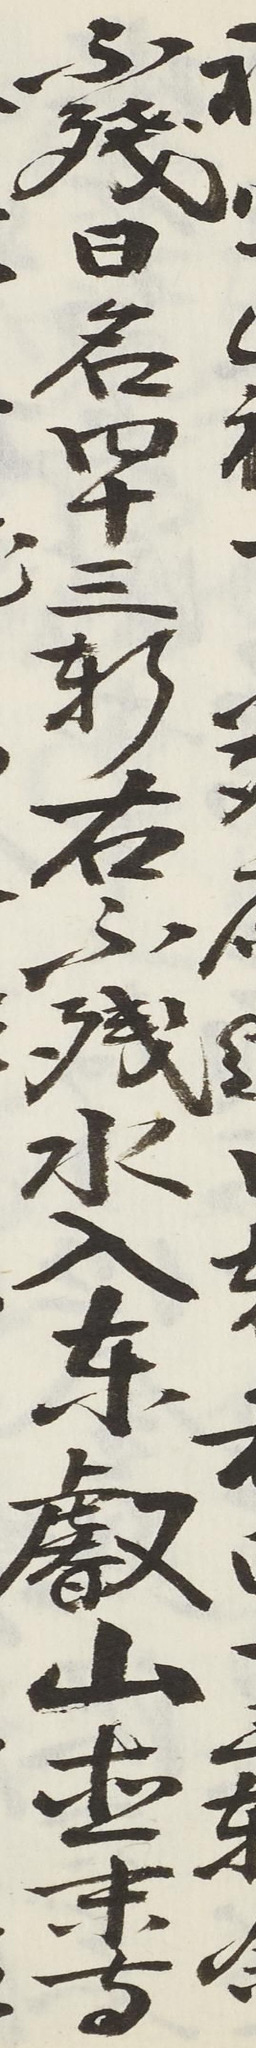不残日名四十三軒右不残水入東叡山直未寺
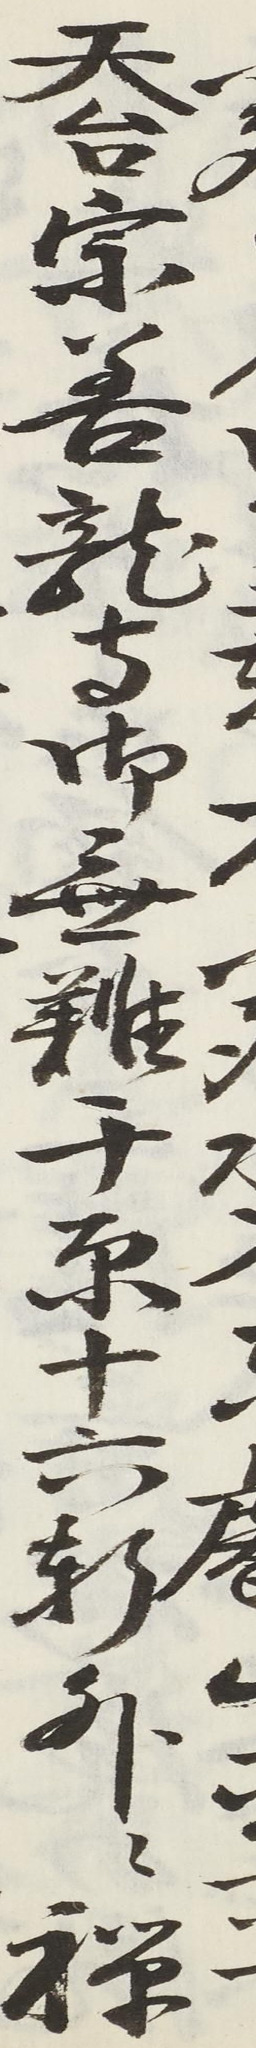天台宗善龍寺御無難千原十六軒外二禅
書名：弘化四年地震記
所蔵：東京大学地震研究所図書室 Earthquake Research Institute Library, The University of Tokyo, JAPAN
